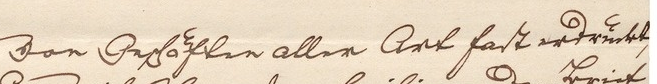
Von Geschäften aller Art fast erdrückt,
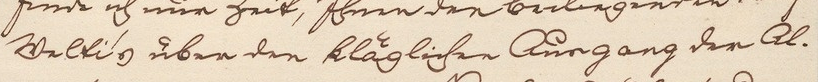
Welti's über den kläglichen Ausgang der Al-
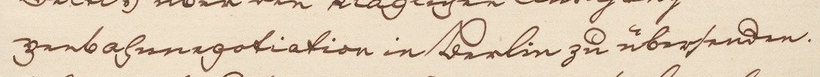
penbahnnegotiation in Berlin zu übersenden.
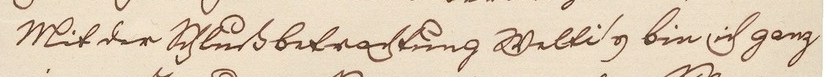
Mit der Schlußbetrachtung Welti's bin ich ganz
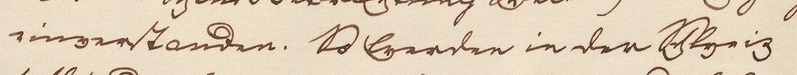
einverstanden. So werden in der Schweiz
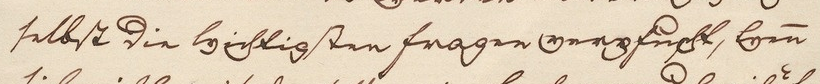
selbst die wichtigsten Fragen verpfuscht, wenn
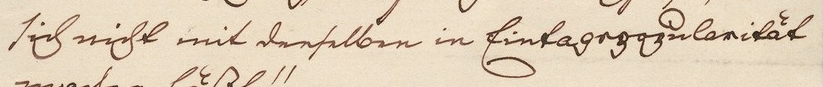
sich nicht mit denselben in Eintagspopularität
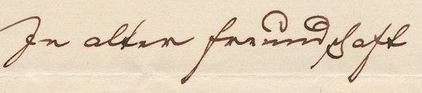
In alter Freundschaft
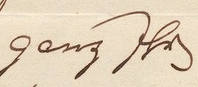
ganz Ihr
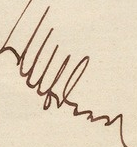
April
